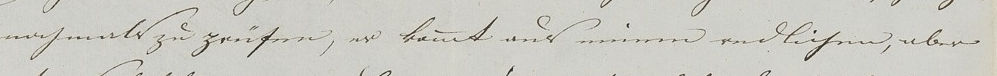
nochmals zu prüfen, er kommt aus einem redlichen, aber
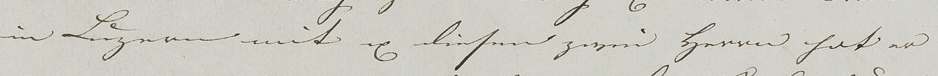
in Luzern mit & diesen zwei Herrn hat er
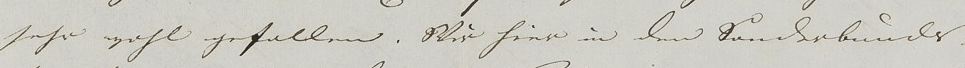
sehr wohl gefallen. Wir hier in den Sonderbunds-
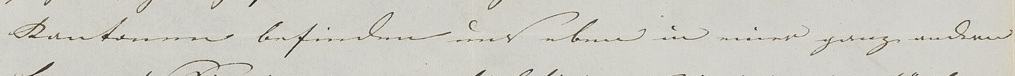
Kantonen befinden uns eben in einer ganz andern
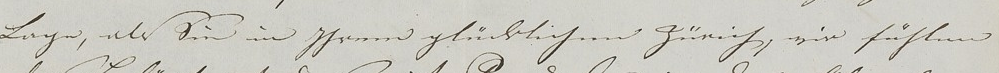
Lage, als Sie in Ihrem glücklichen Zürich, wir fühlen
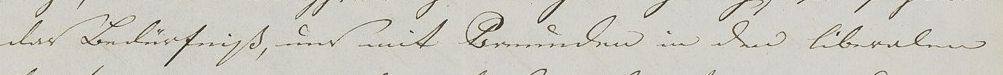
das Bedürfniß, uns mit Freunden in den liberalen
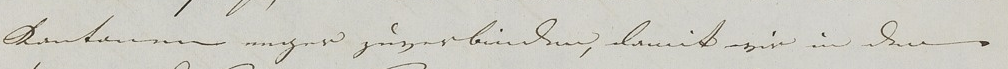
Kantonen enger zuverbinden, damit wir in den
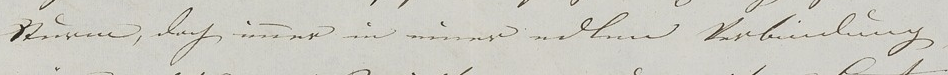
Sturm, doch immer in einer edlen Verbindung
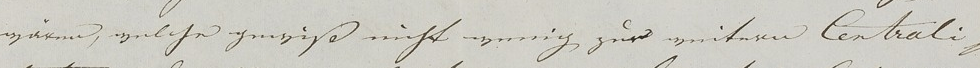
wären, welche gewiß nicht wenig zur weitern Centrali -
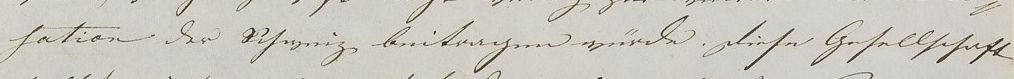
sation beitragen würde. Diese Gesellschaft
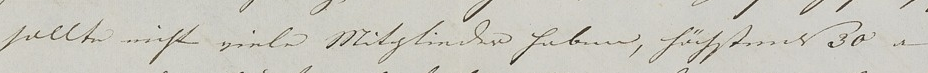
sollte nicht viele Mitglieder haben, höchstens 30 a
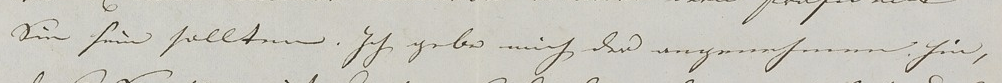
Sie sein sollten. Ich gebe mich der angenehmen hin,
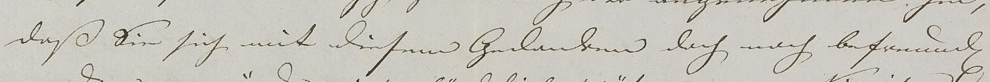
daß Sie sich mit diesen Gedanken doch nach befreunden
